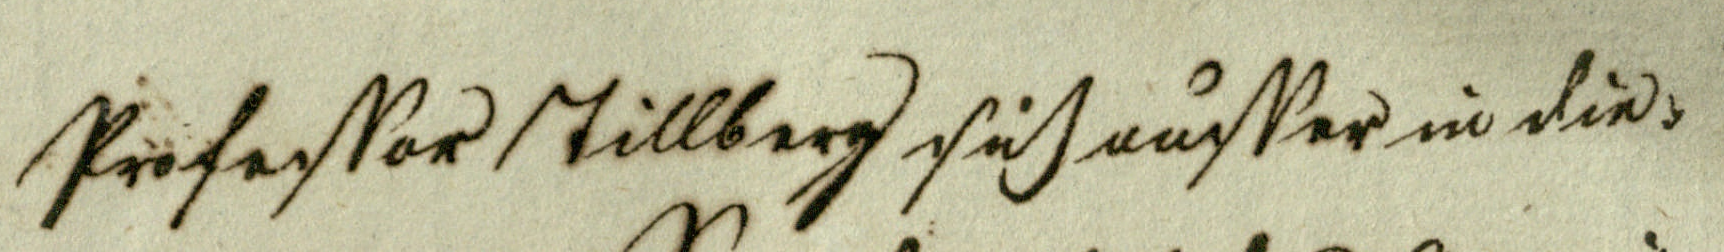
Professor Tillberg sich ausser in die¬
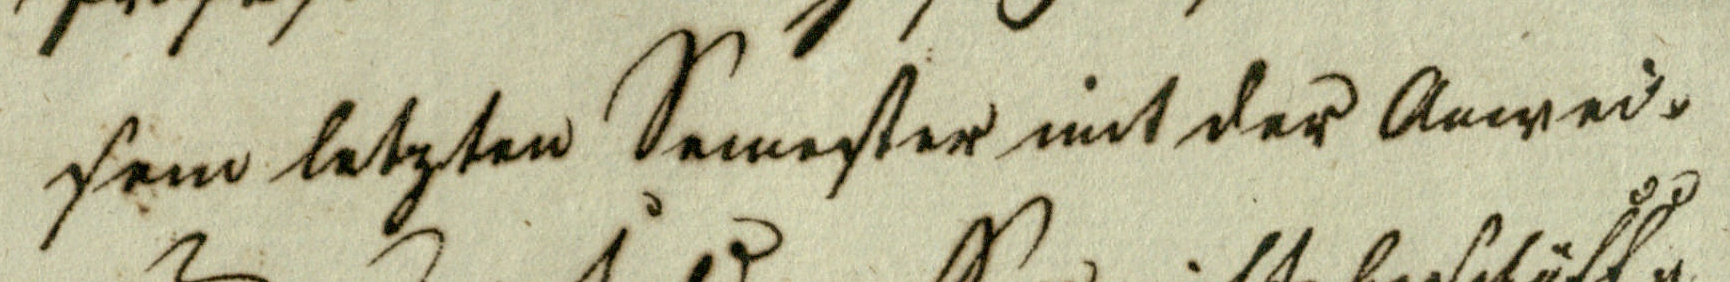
sem letzten Semester mit der Anwei¬
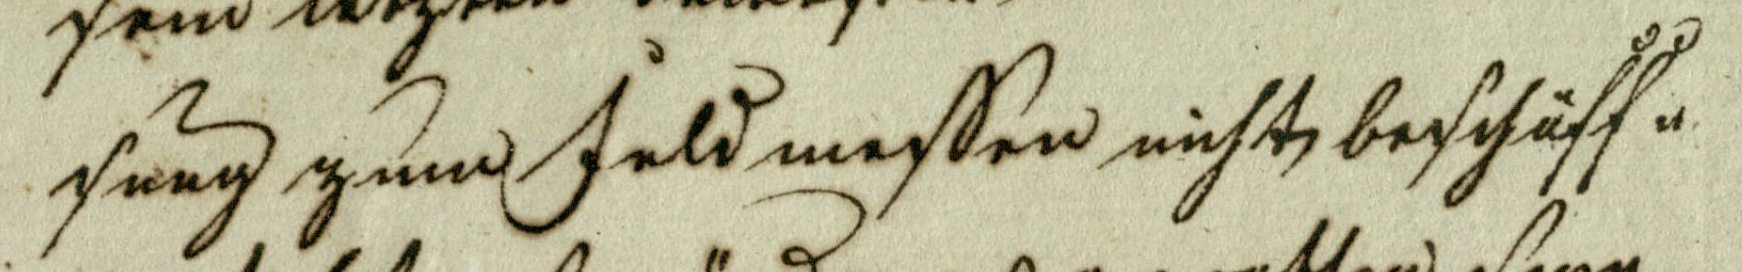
sung zum Feldmessen nicht beschäff¬
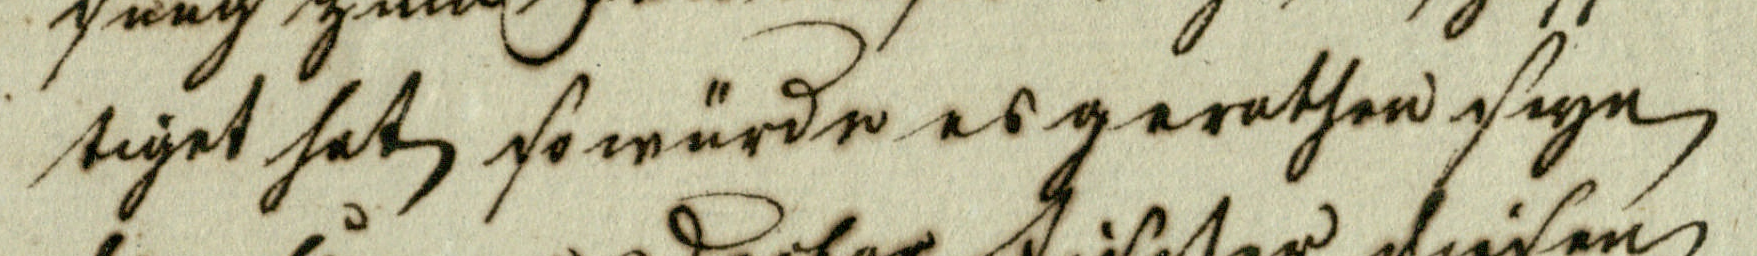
tiget hat, so würde es gerathen seyn,
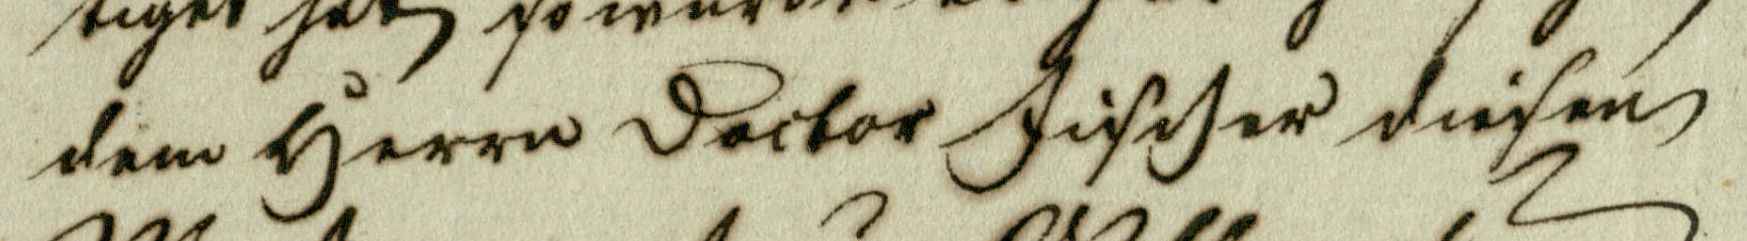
dem Herrn Doctor Fischer diesen
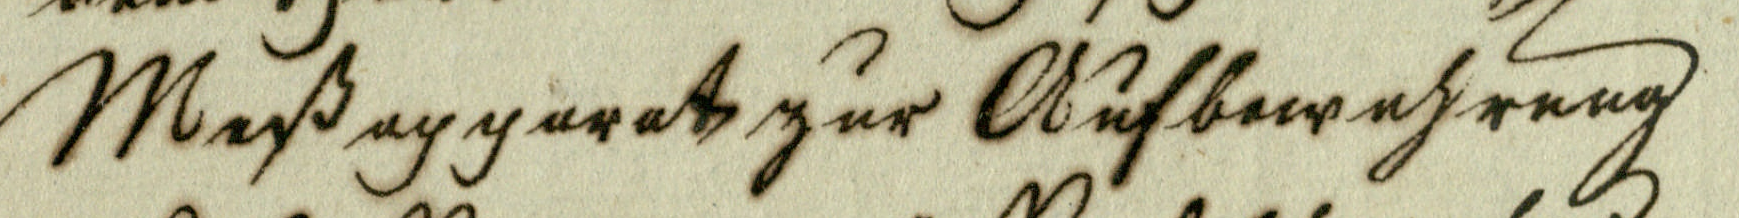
Meßapparat zur Aufbewahrung
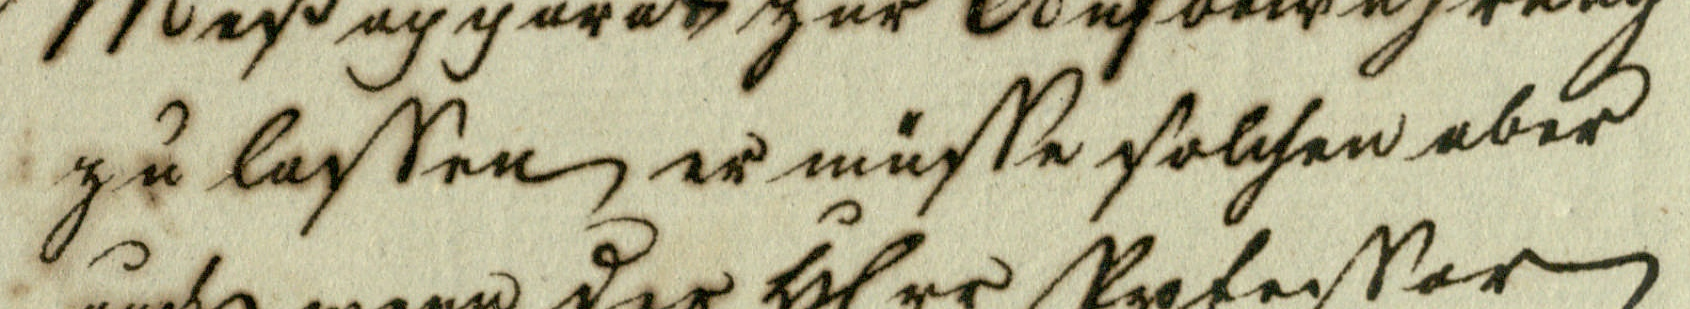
zu lassen, er müsse solchen aber
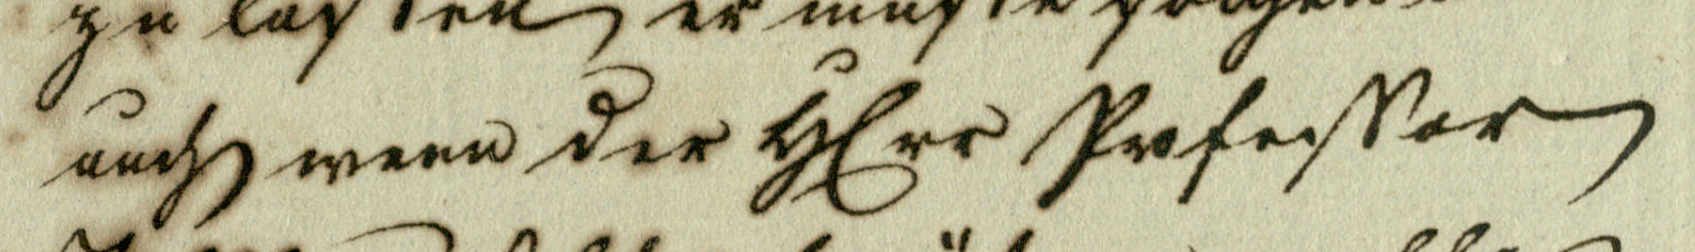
auch, wenn der Herr Professor
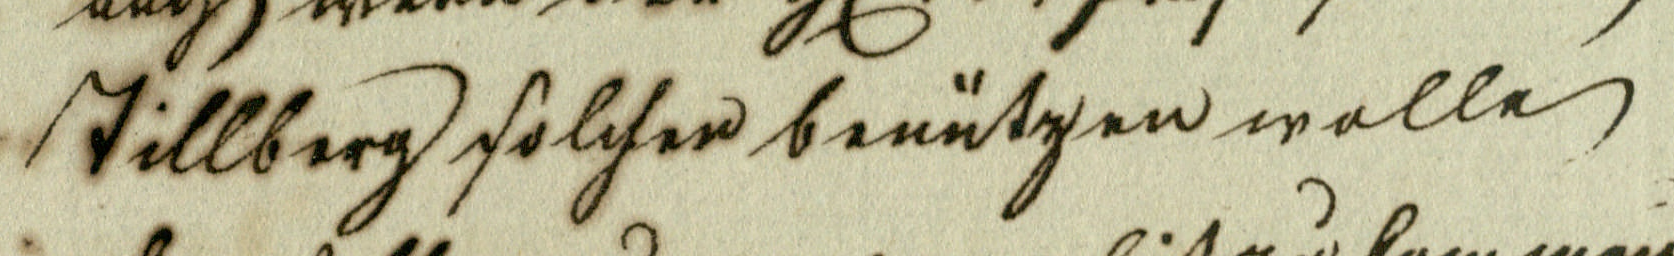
Tillberg solchen benützen wolle,
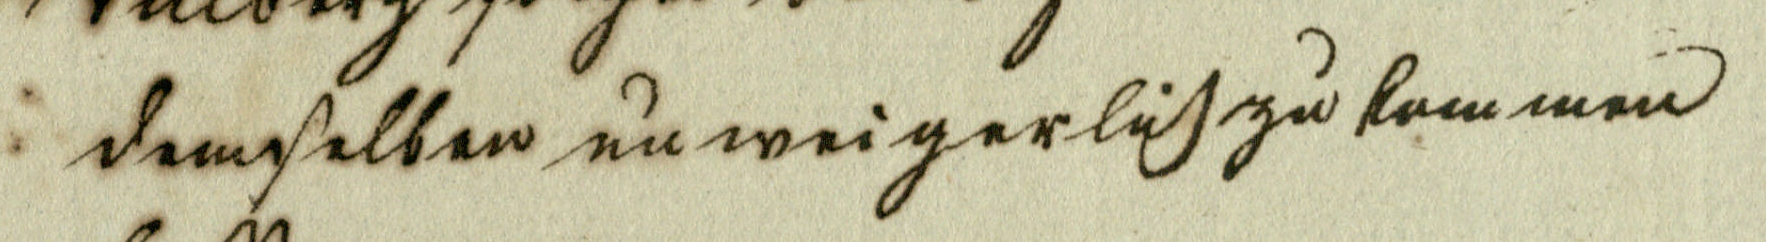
demselben unweigerlich zukommen
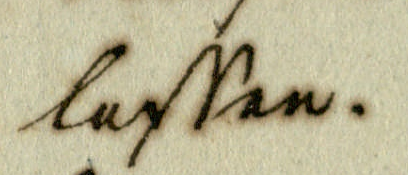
lassen.
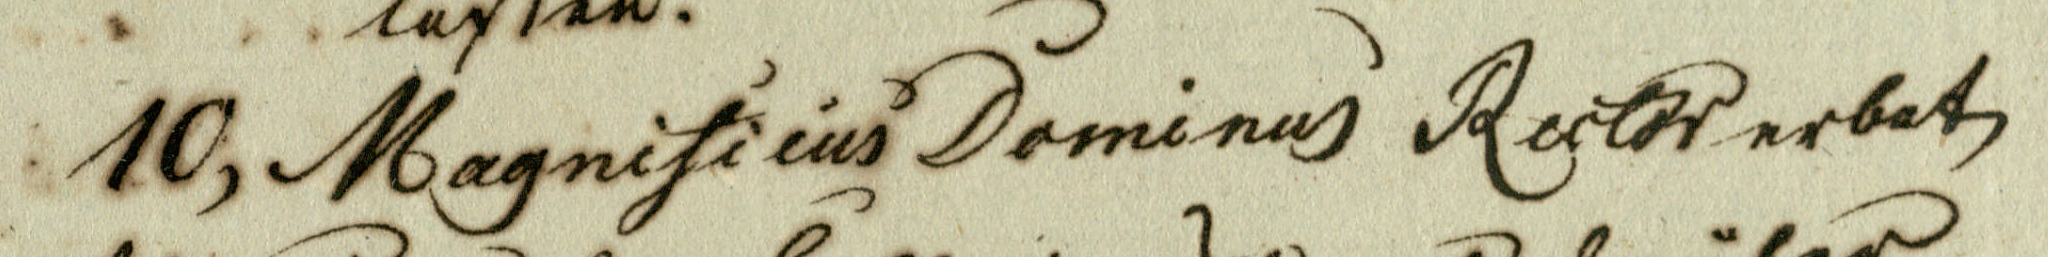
10, Magnificus Dominus Rector erbat
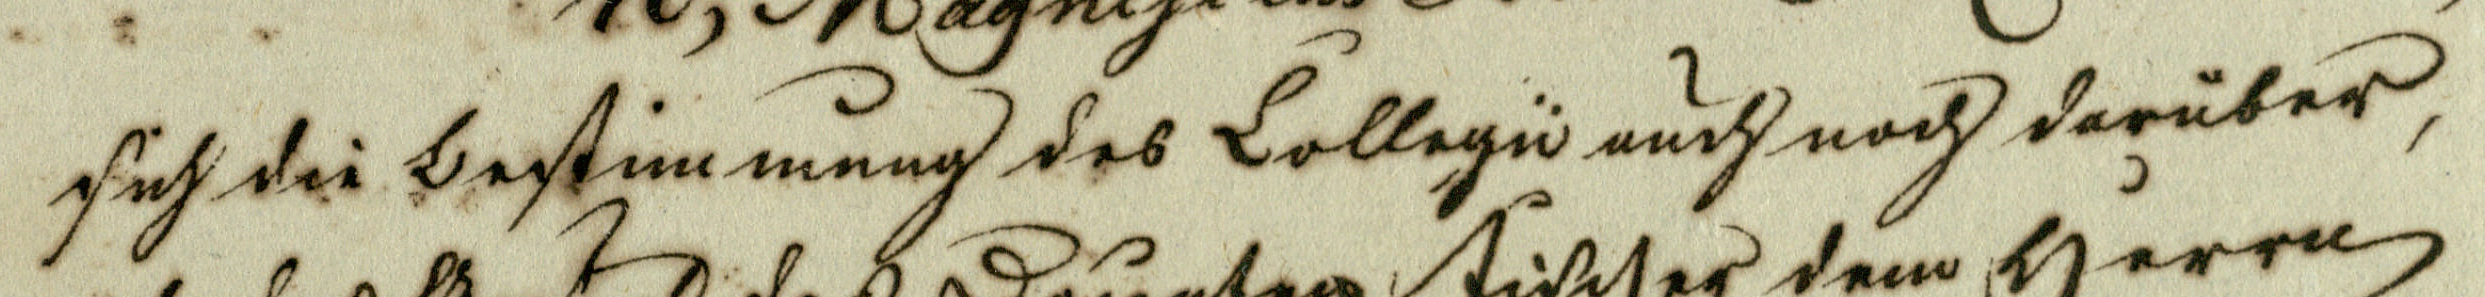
sich die Bestimmung des Collegii auch noch darüber,
